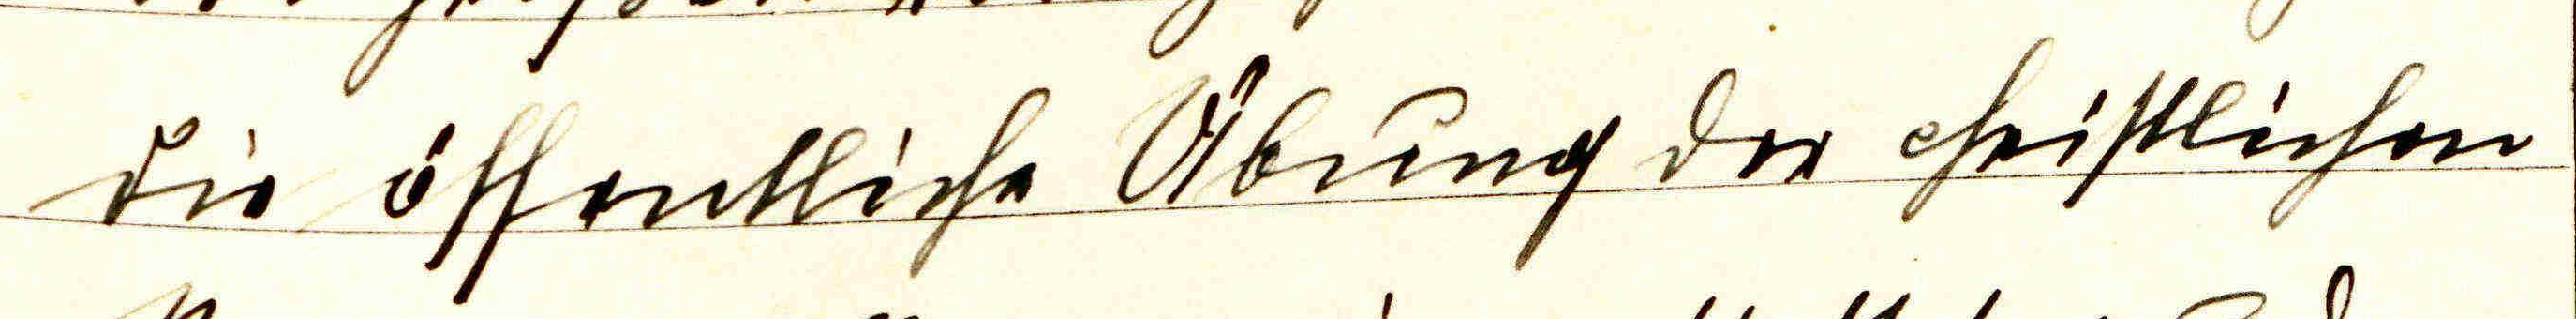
die öffentliche Übung der christlichen
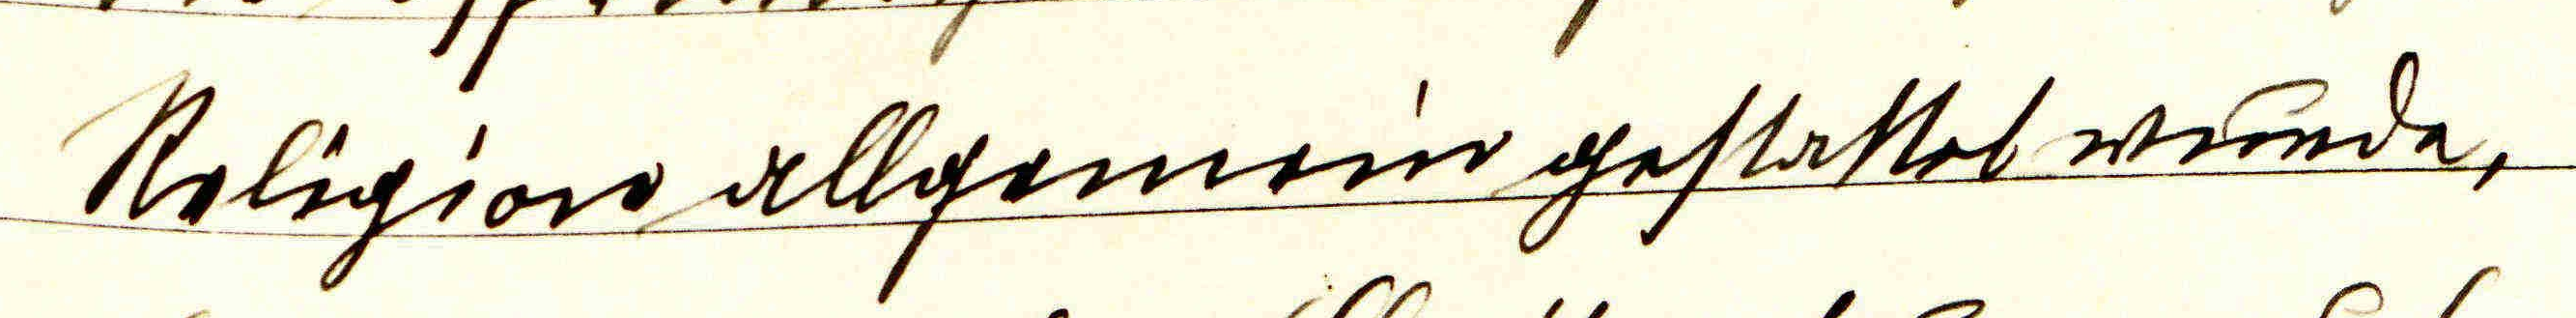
Religion allgemein gestattet wurde,
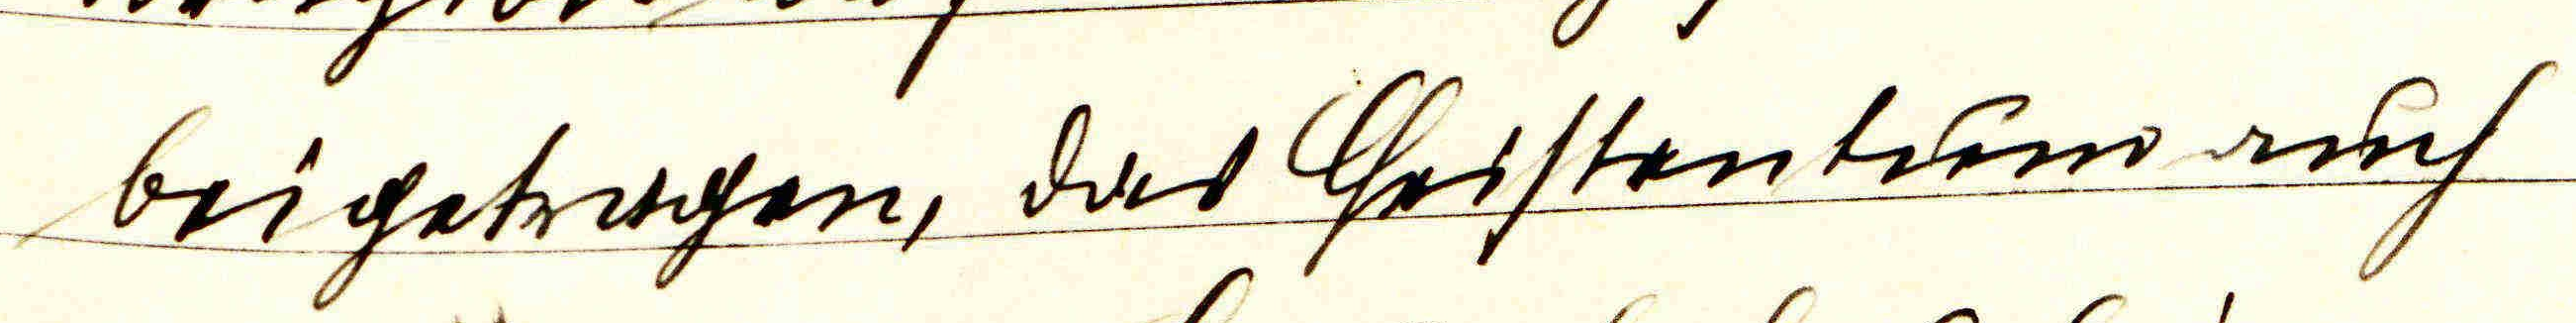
beigetragen, das Christentum auch
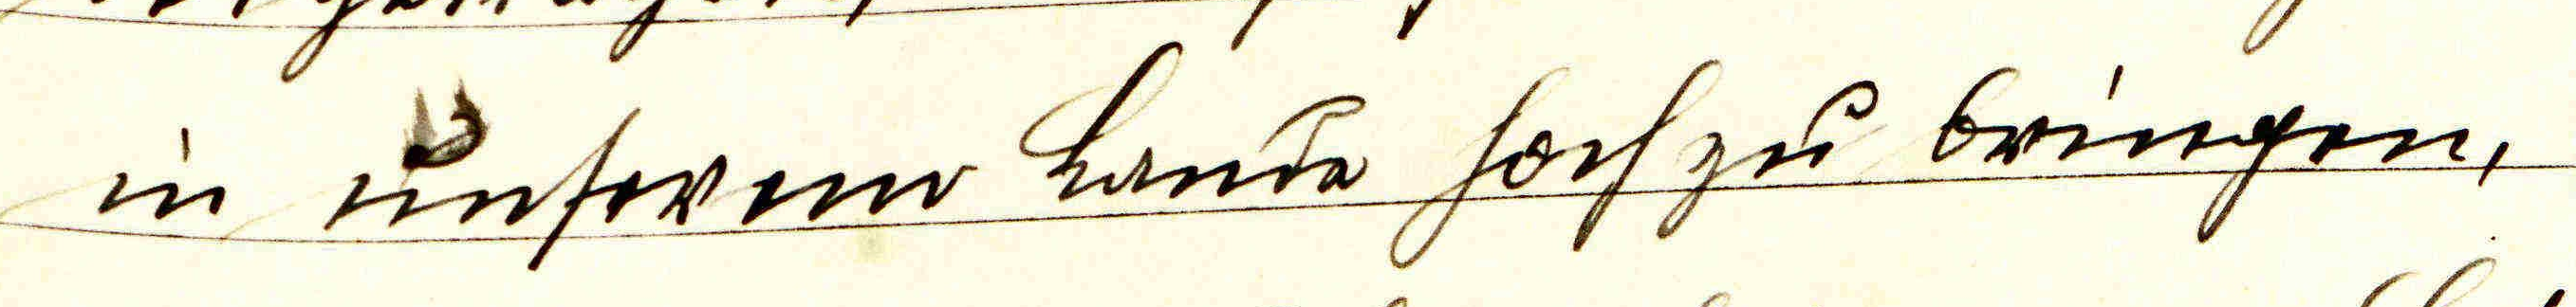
in unserem Lande hoch zu bringen,
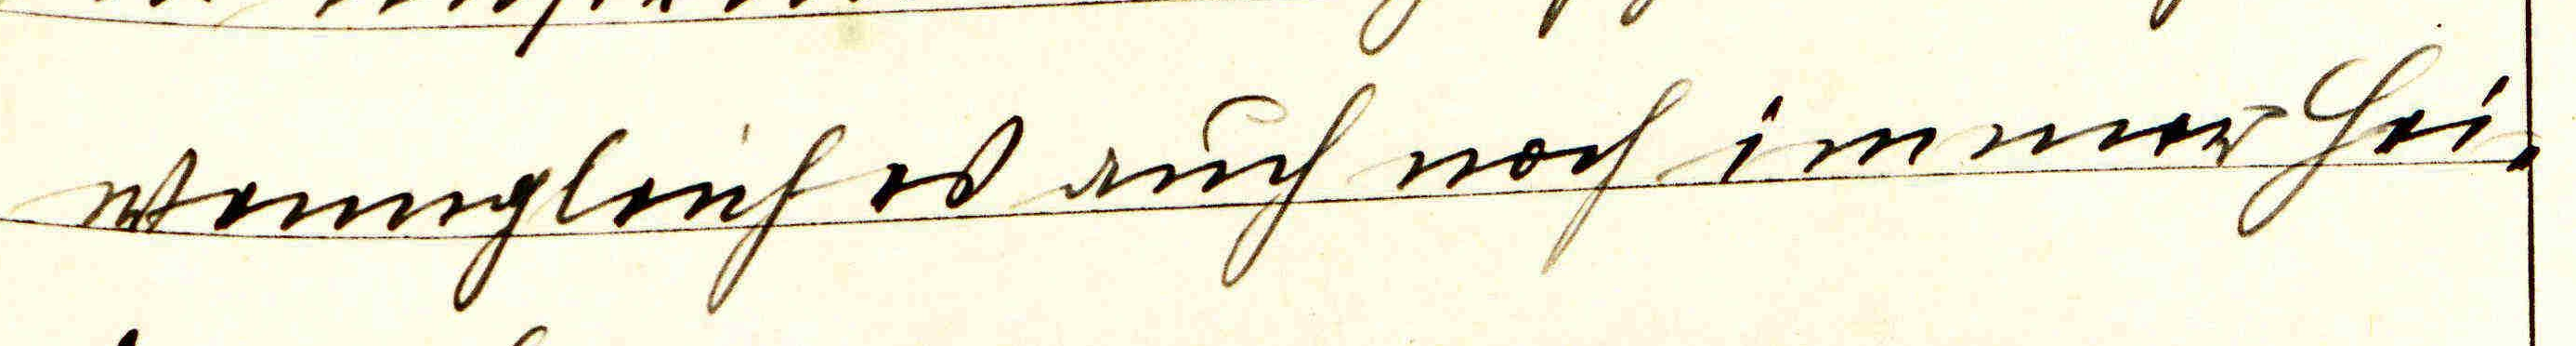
wenngleich es auch noch immer Hei-
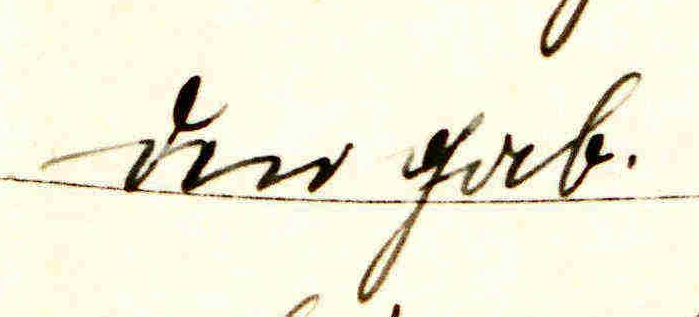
den gab.
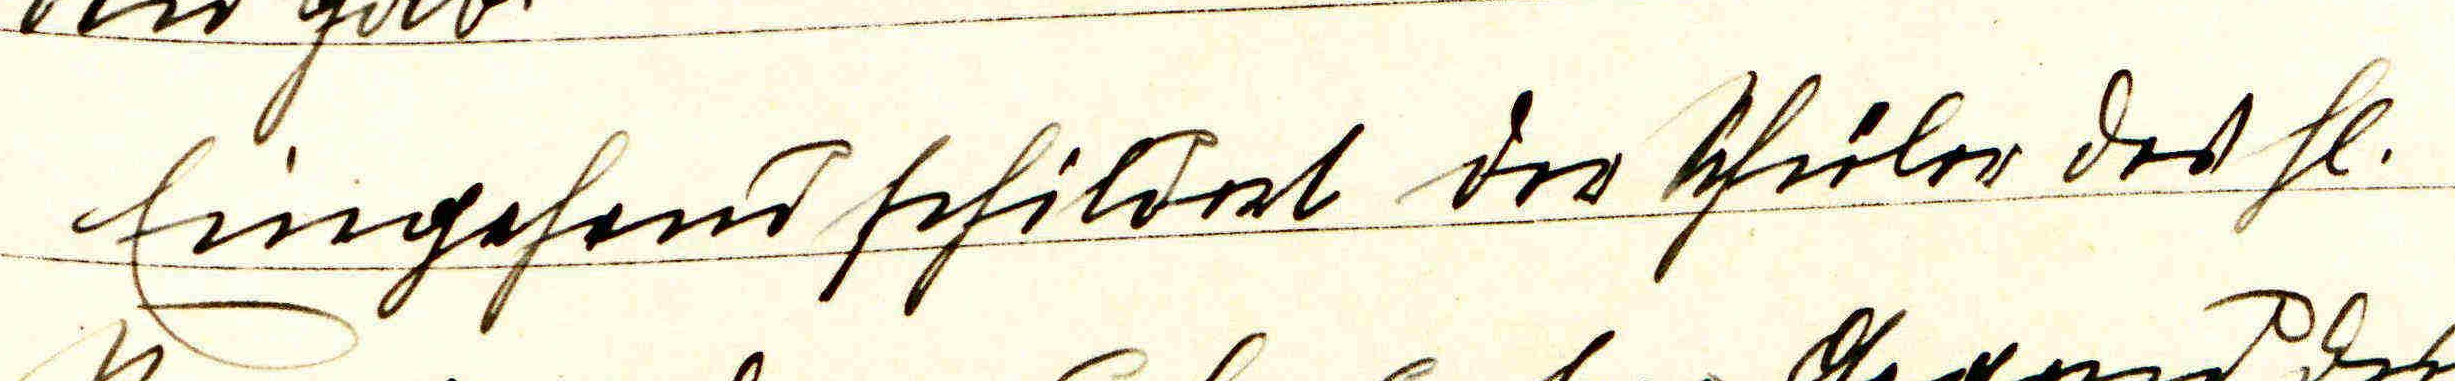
Eingehens schildert der Schüler des Hl.
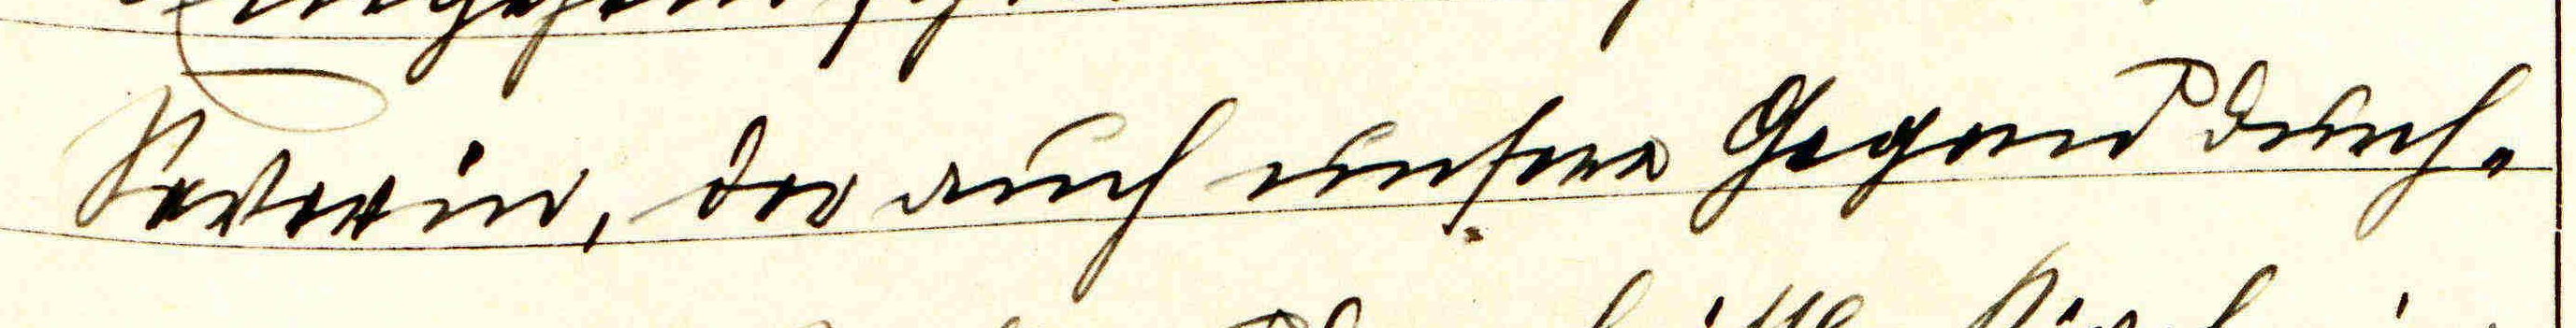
Severin, der auch unsere Gegend durch-
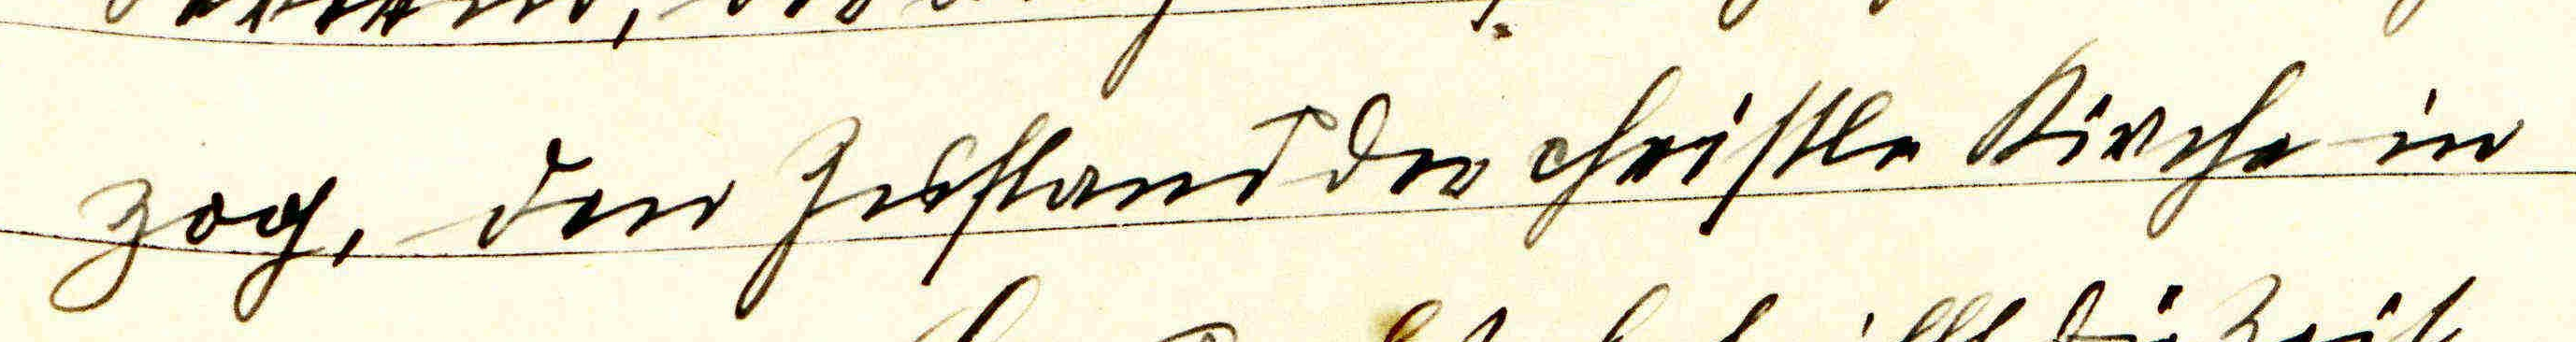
zog, den Zustand der christl. Kirche in
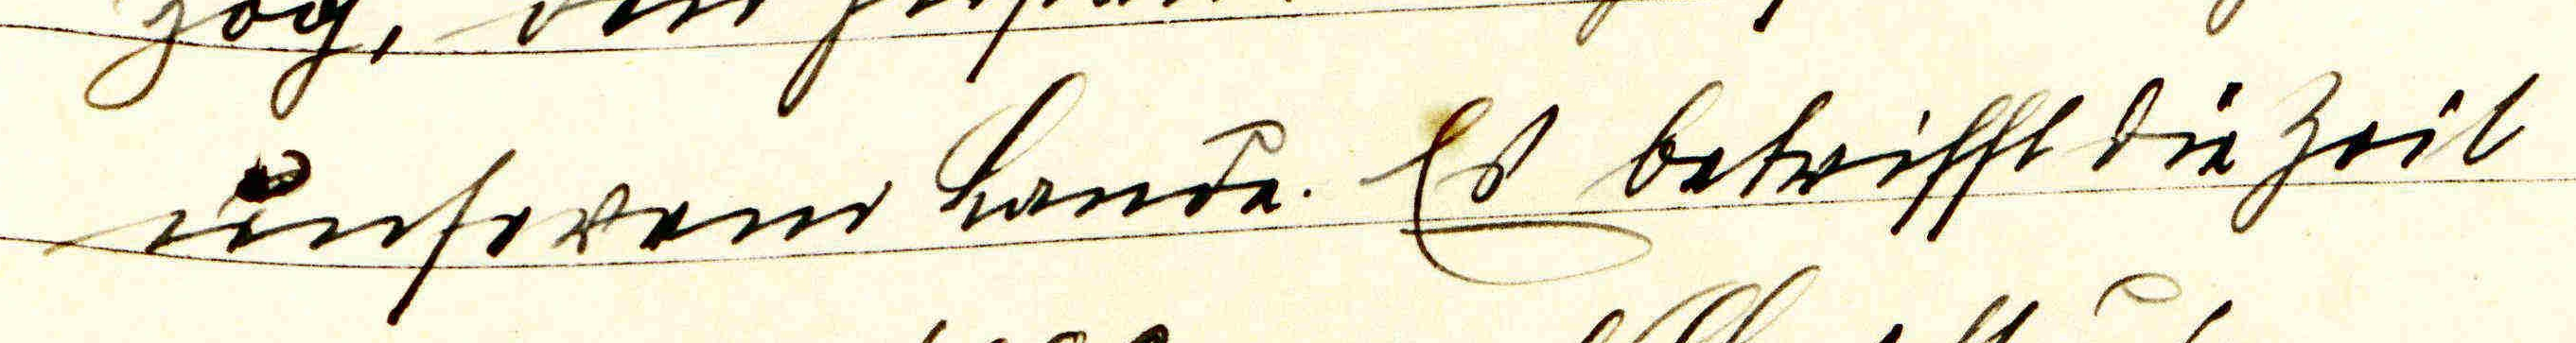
unserem Lande. Es betrifft die Zeit
